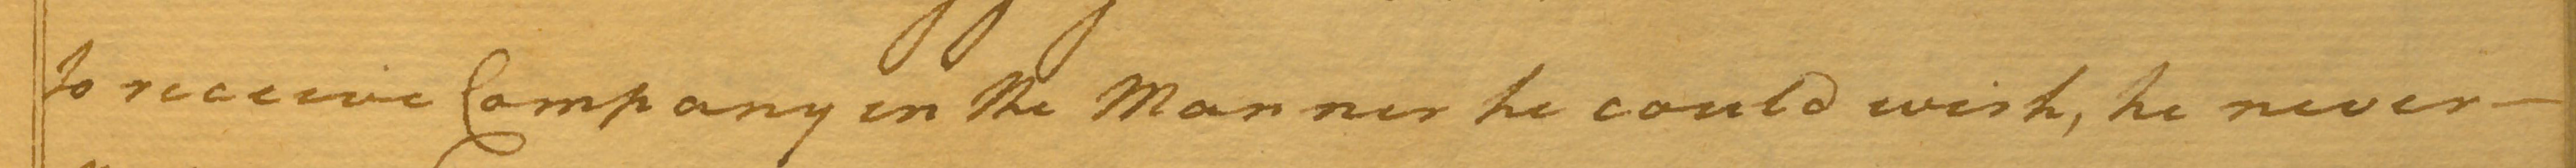to receive Company in the Manner he could wish, he never-
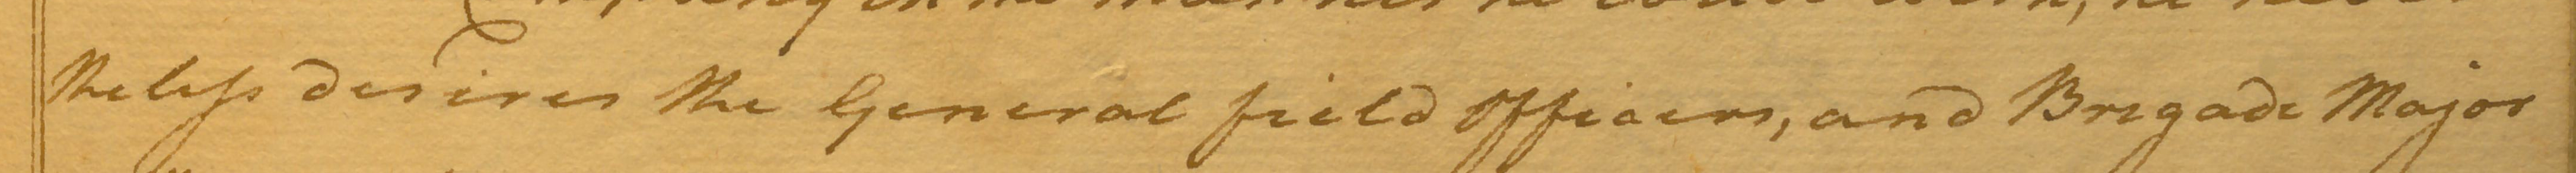theless desires the General field officers, and Brigade Major
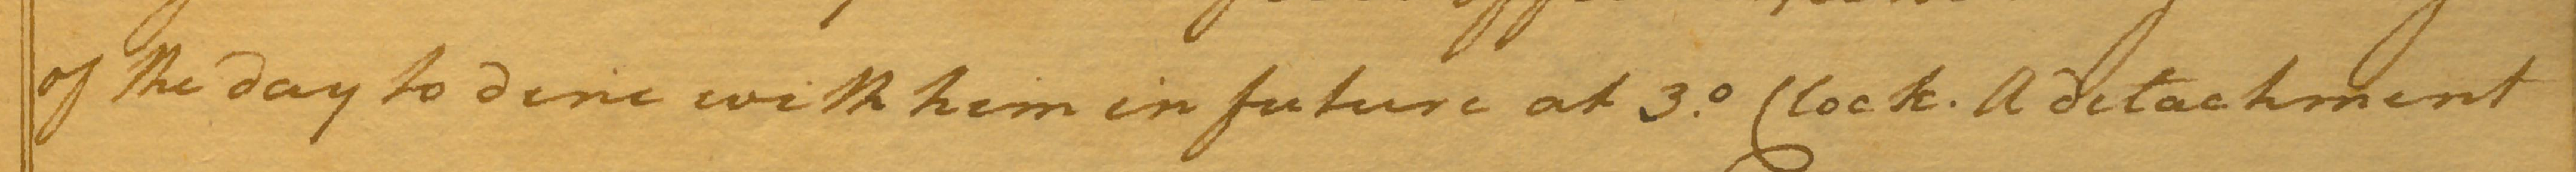of the day to dine with him in future at 3. ^oClock. A detachment
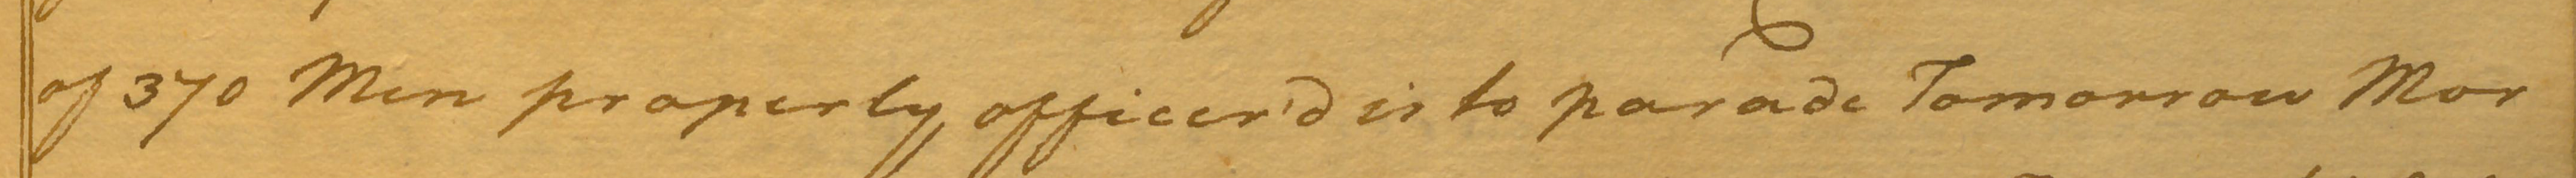of 370 Men properly officer'd is to parade Tomorrow Mor
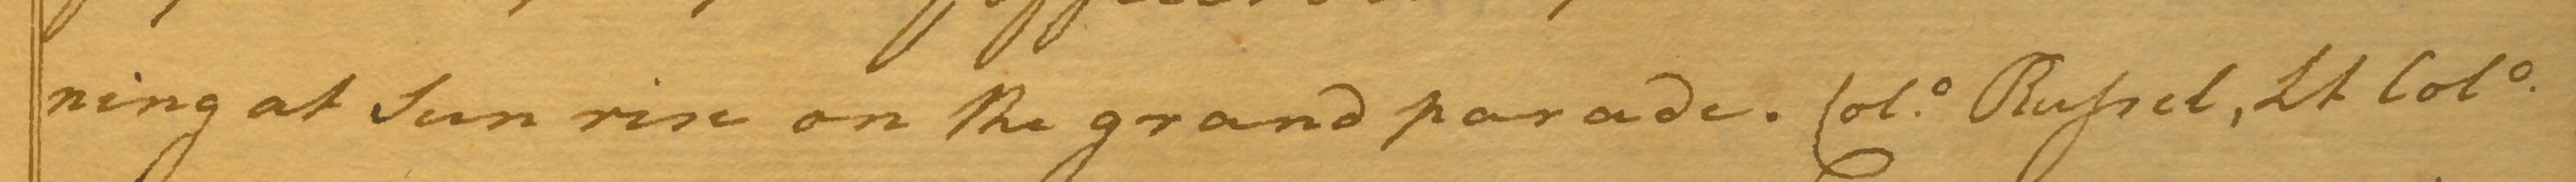ning at sun rise on the grand parade. Col^o. Russel, Lt Col^o.
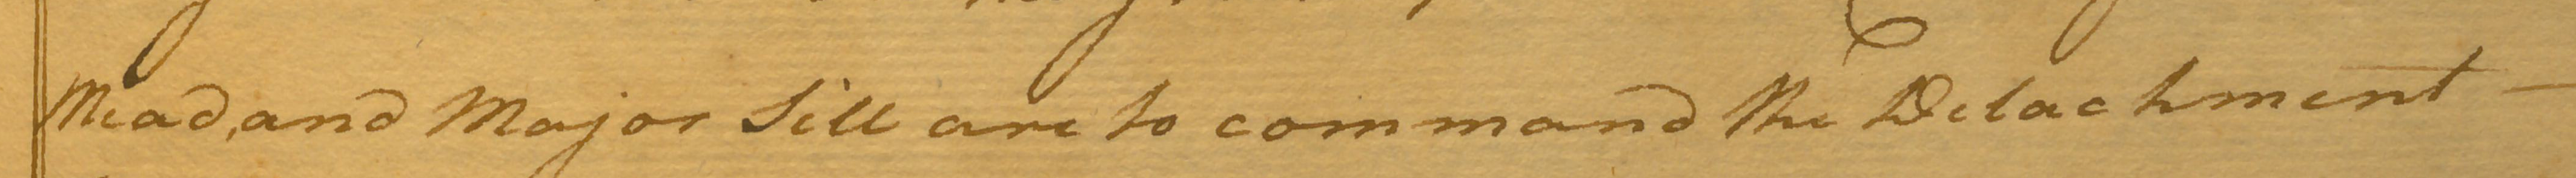Mead, and Major Sill are to command the Detachment-
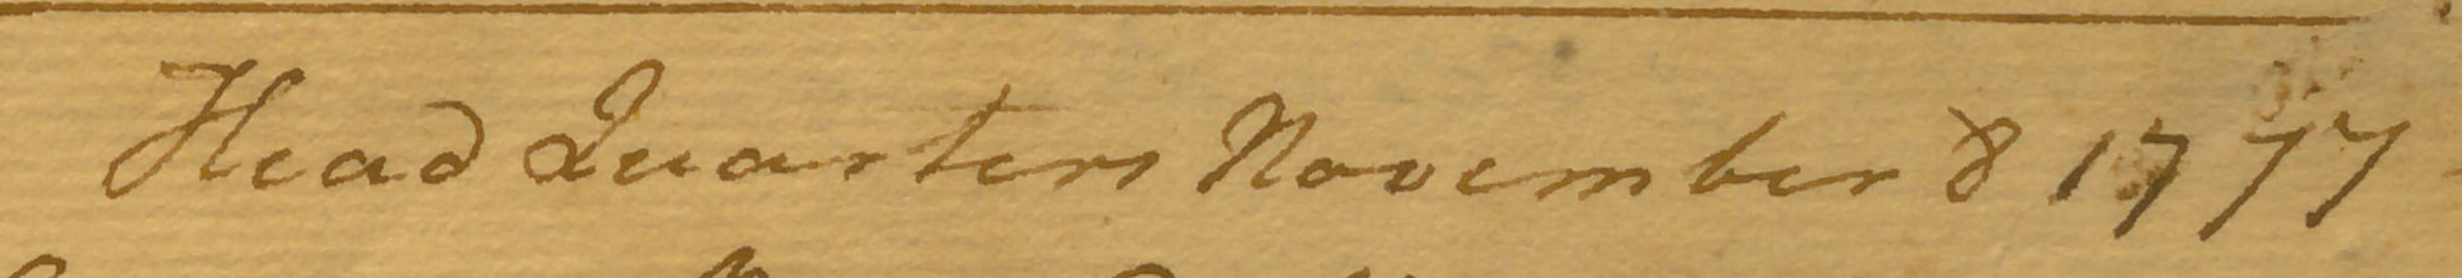Head Quarters November 8 1777
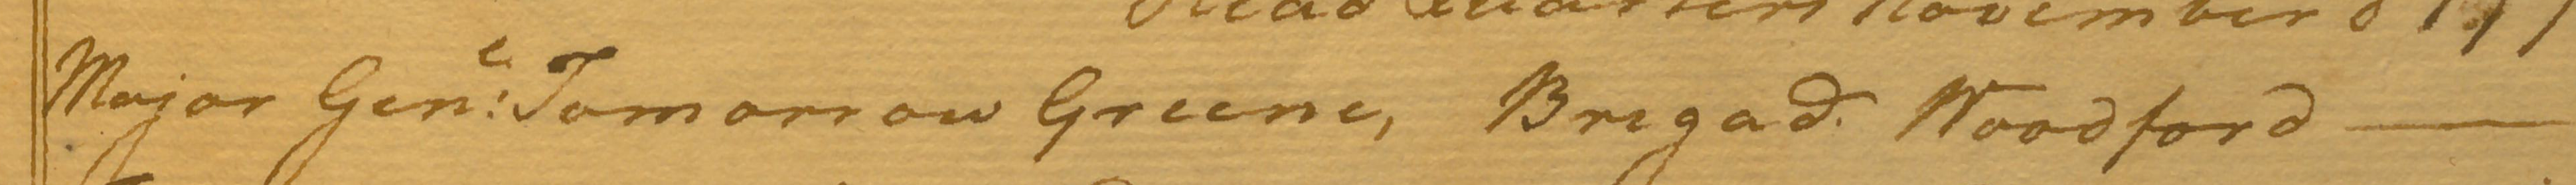Major Gen^l. Tomorrow Greene, Brigad. Woodford-
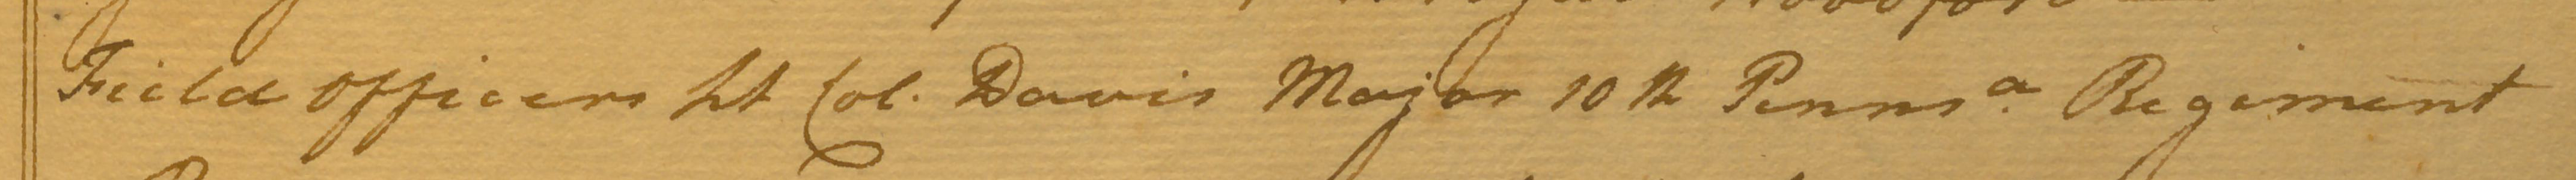Field officers Lt Col. Davis Major 10th Penns^a. Regiment
